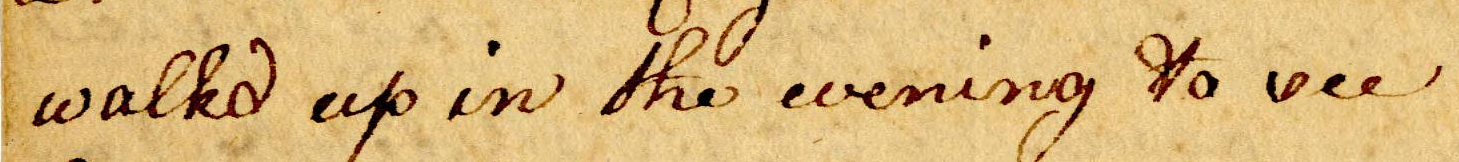walkd up in the evening to see
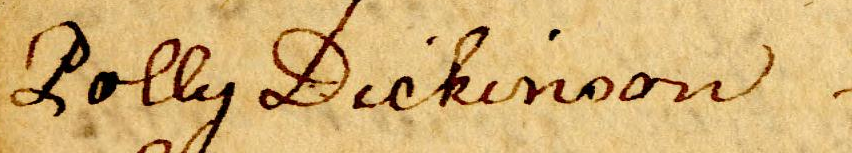Polly Dickinson -
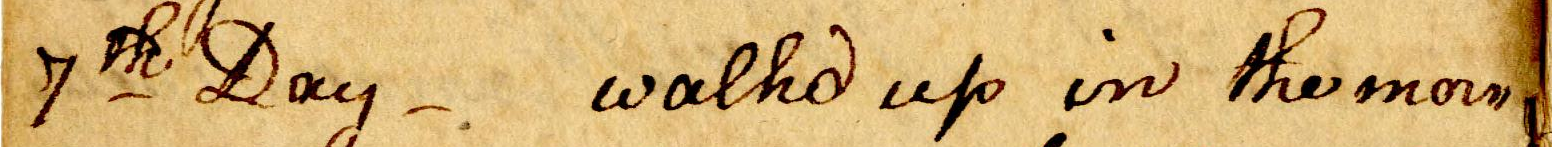7^th Day- walkd up in the morn
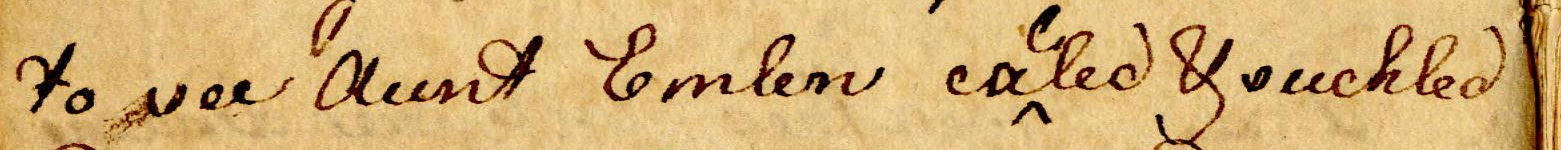to see Aunt Emlen ca ^l led & suckled
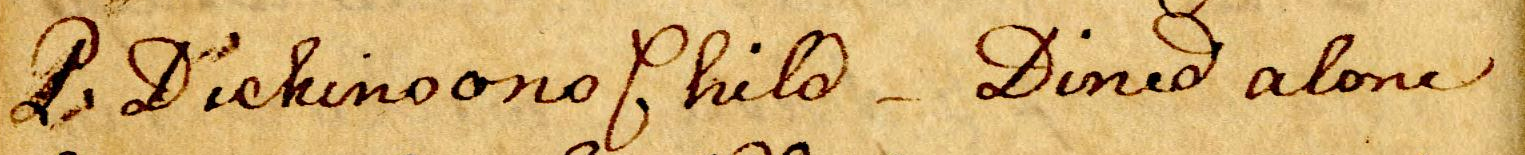P. Dickinsons Child- Dined alone
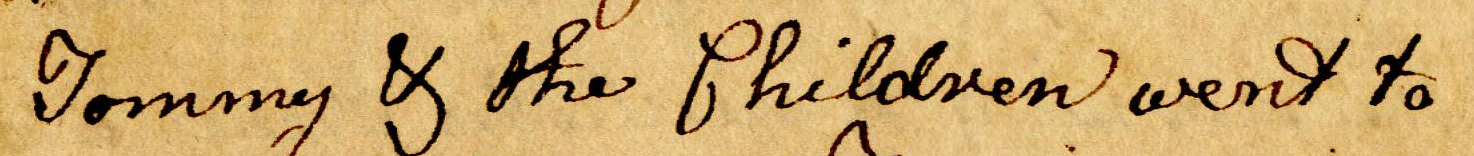Tommy & the Children went to
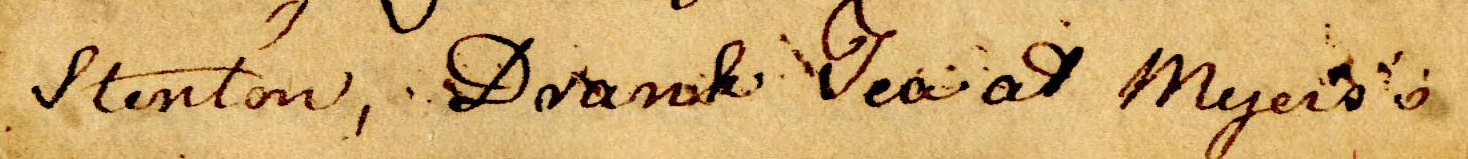Stenton, Drank Tea at Myers's
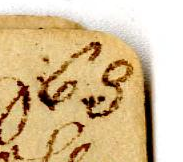63
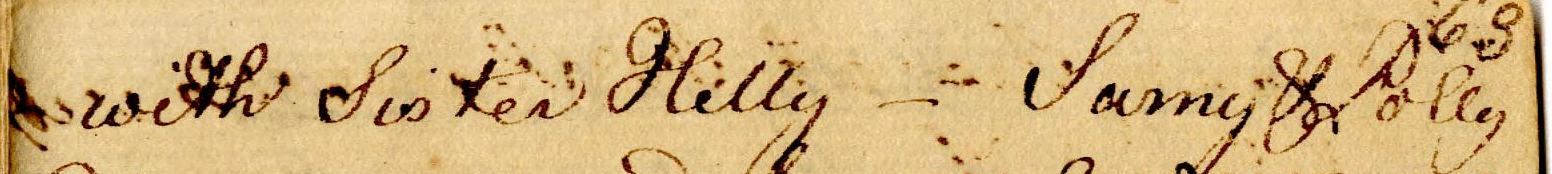with Sister Hetty- Samy & Polly
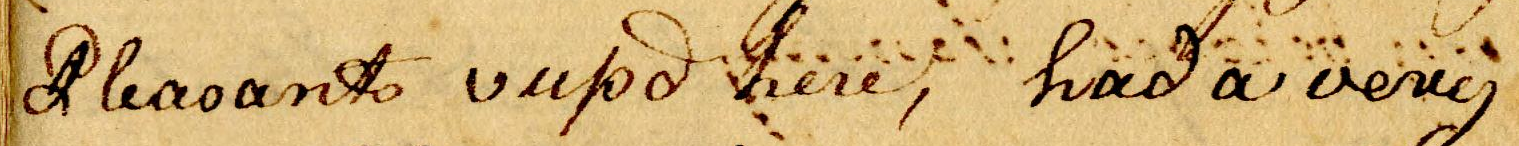Pleasants supd here, had a very
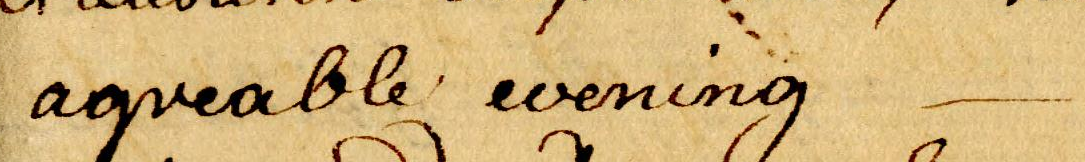agreable evening-
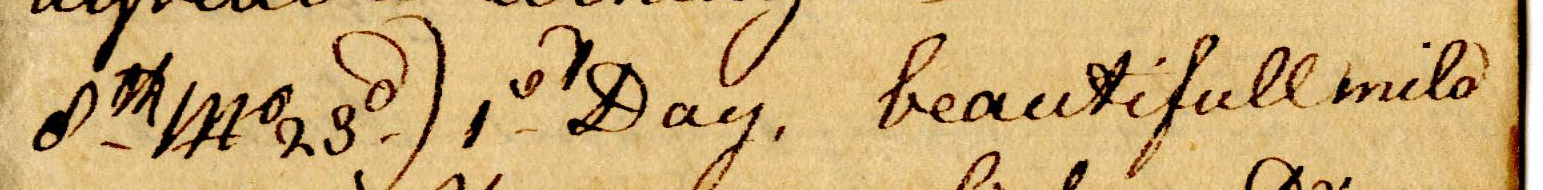8^th M^o 23^d) 1^st Day, beautifull mild
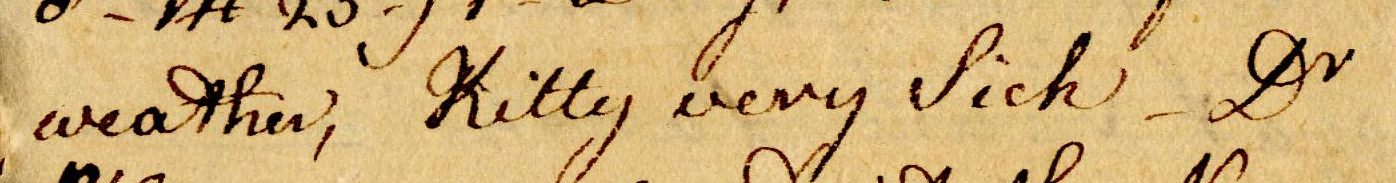weather, Kitty very Sick- D^r
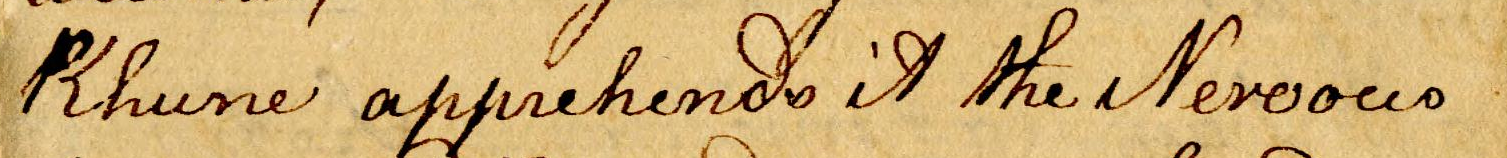Khune apprehends it the Nervous
